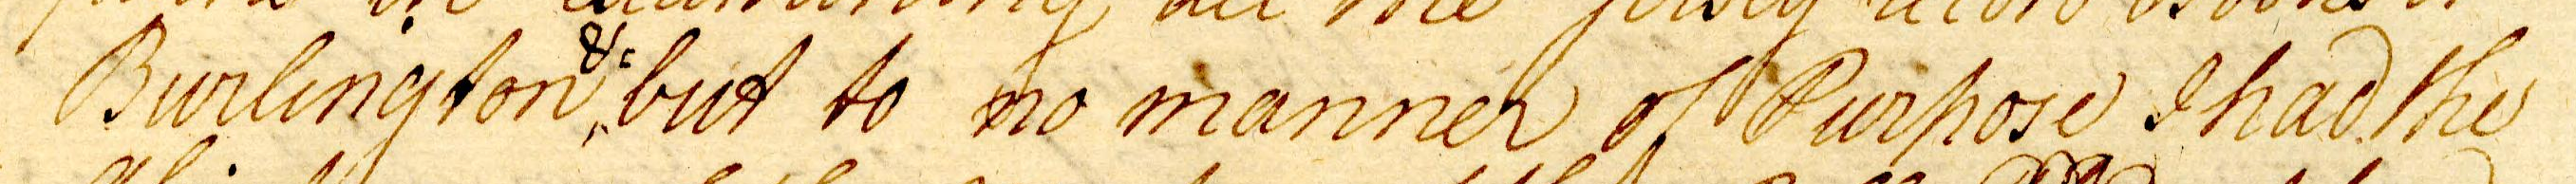Burlington ^&c but to no manner of Purpose I had the
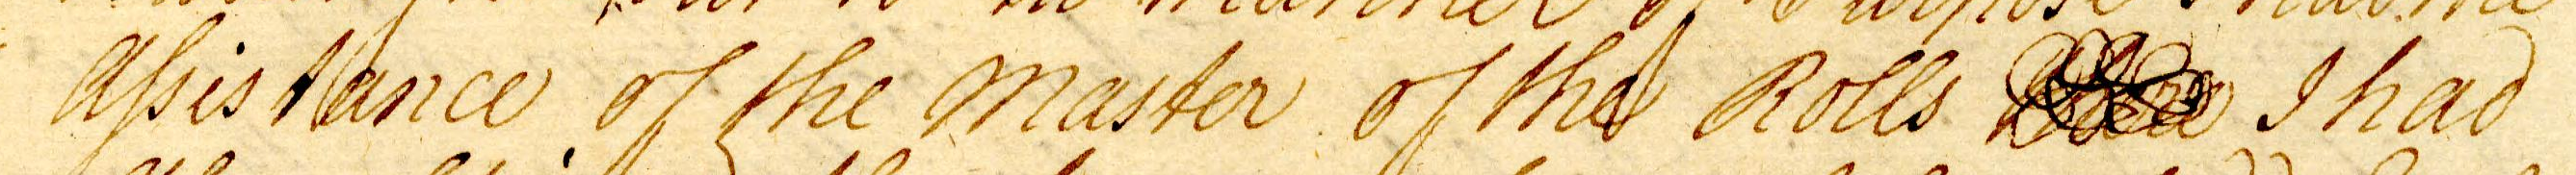Assistance of the Master of the Rolls I had
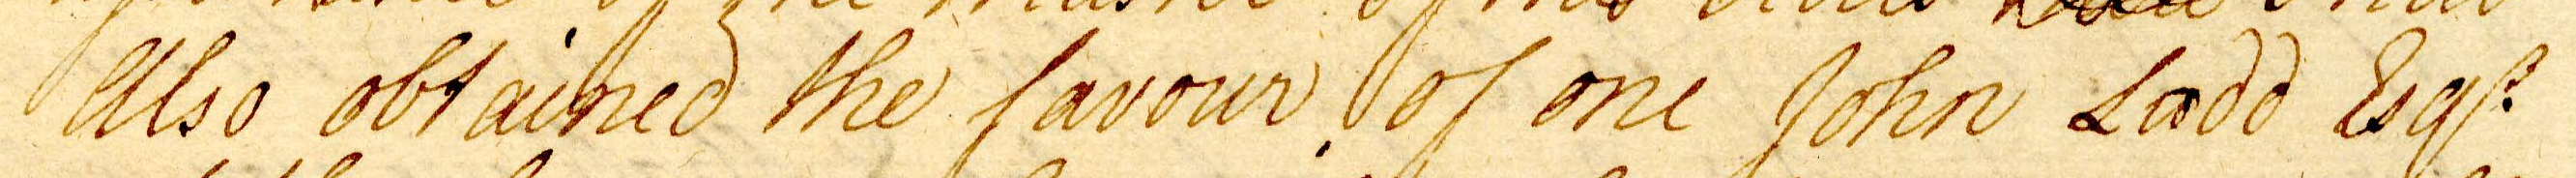Also obtained the favour of one John Ladd Esq^r.
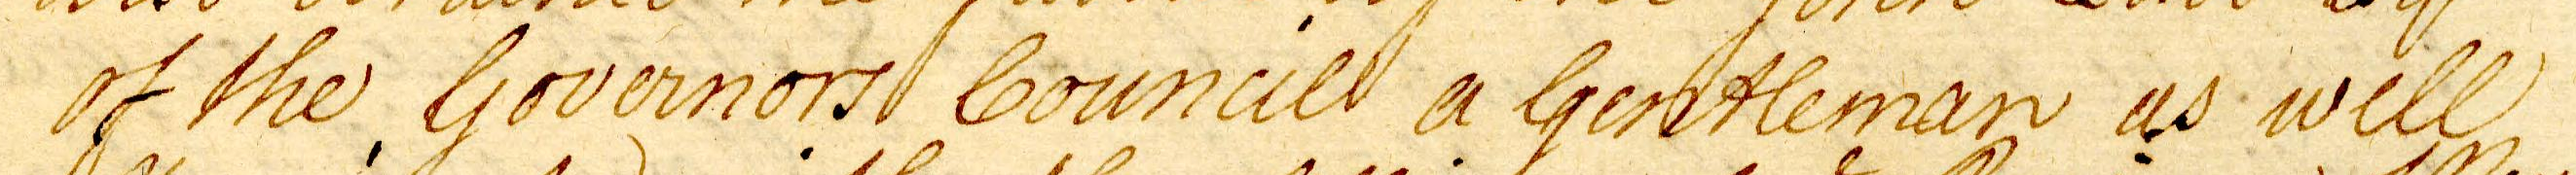of the Governors Council a Gentleman as well
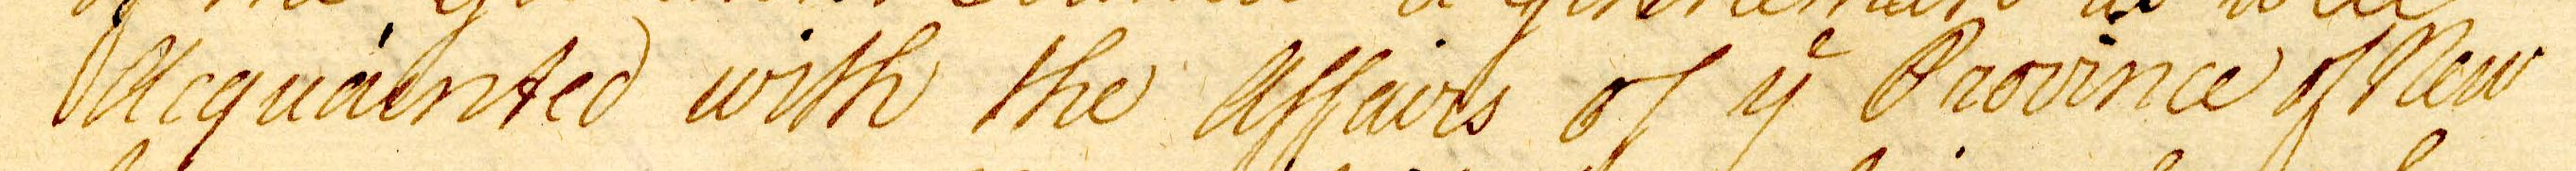Acquainted with the Affairs of y^e Province of New
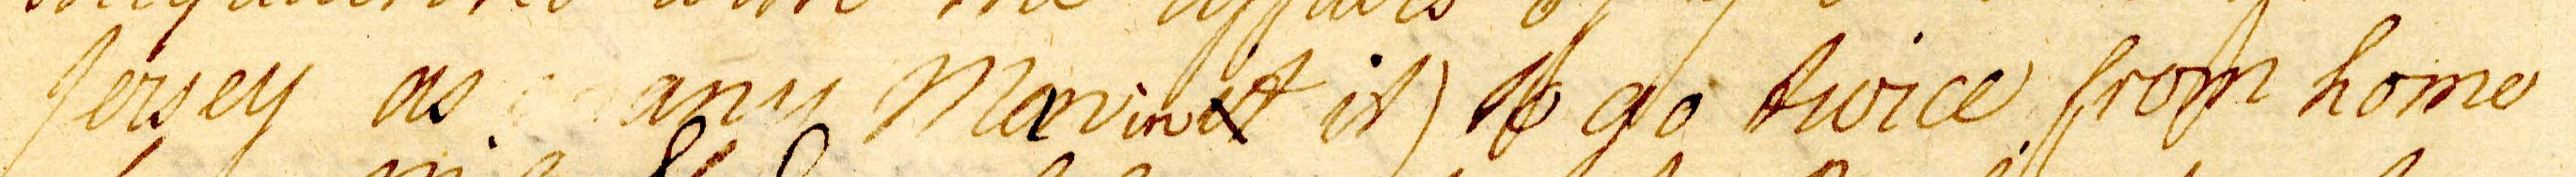Jersey as any Man in [it] it) per go twice from home
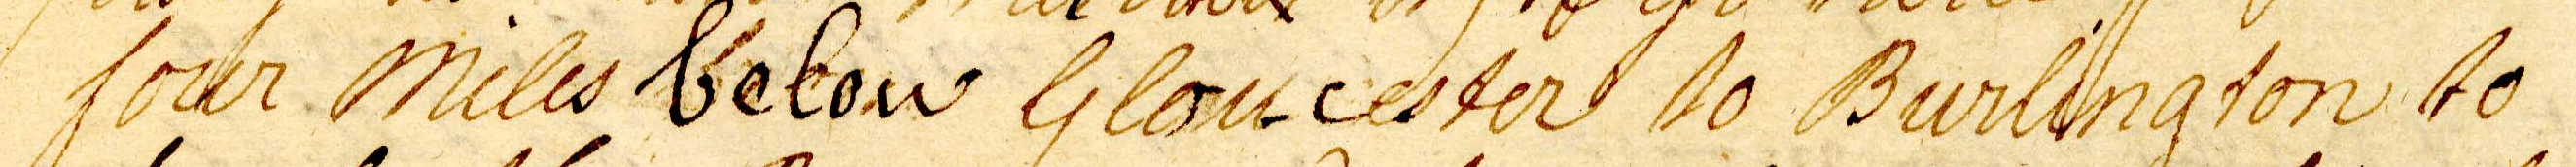four Miles below Gloucester to Burlington to
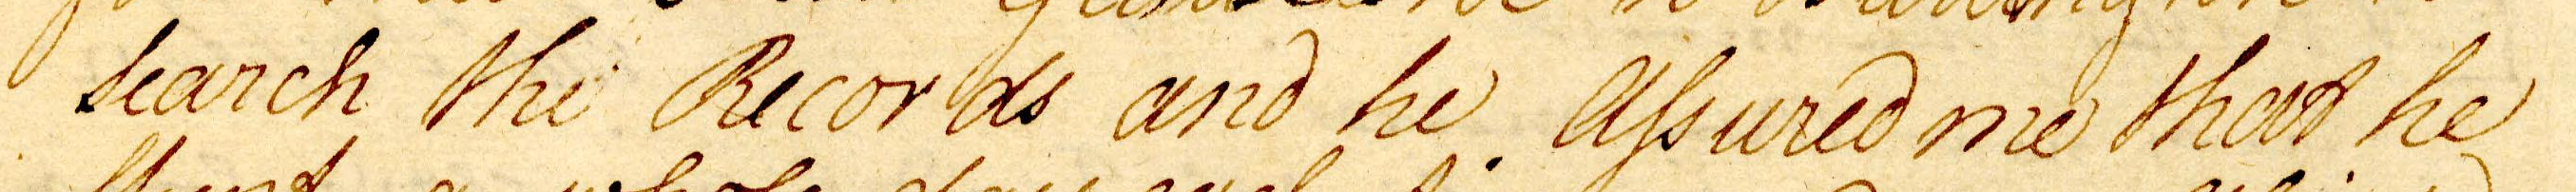Search the Records and he Assured me that he
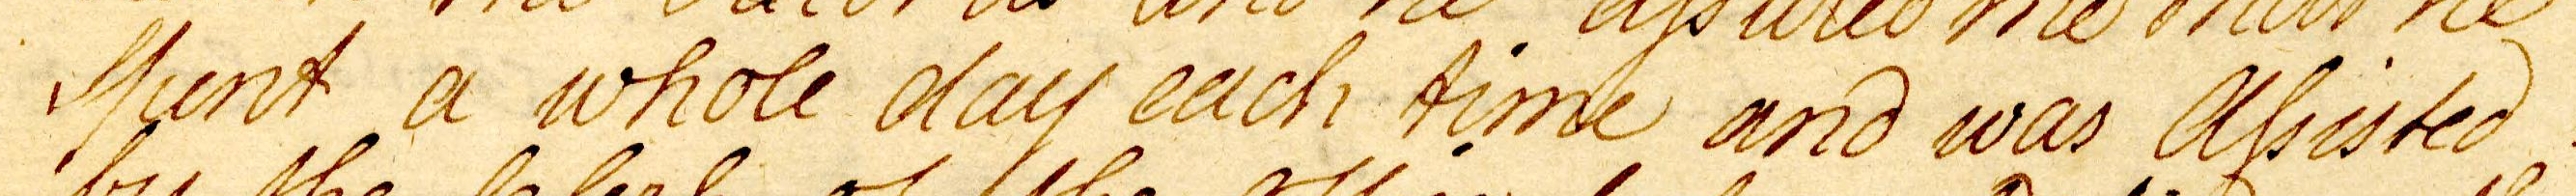Spent a whole day each time and was Assisted
